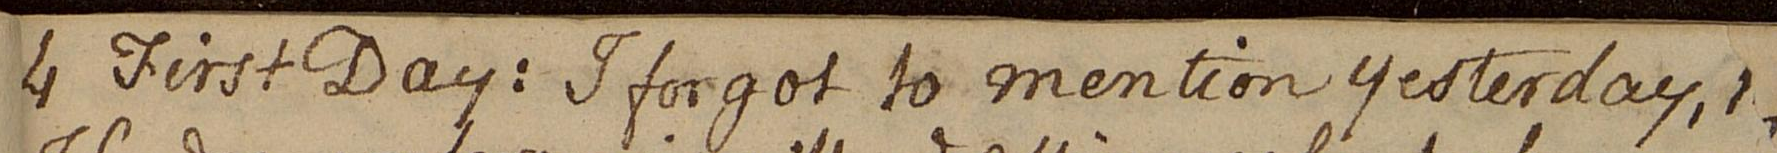4 First Days: I forgot to mention yesterday, I
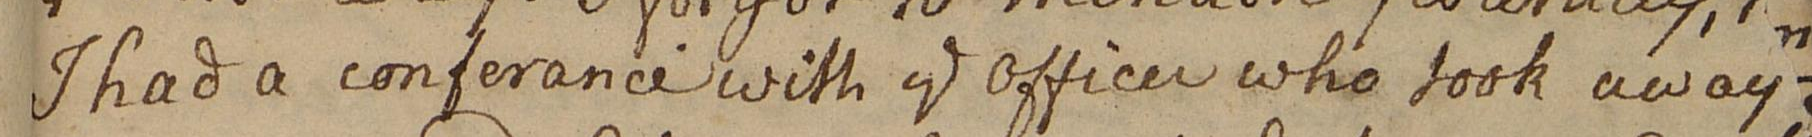I had a conferance with y^e Officer who took away
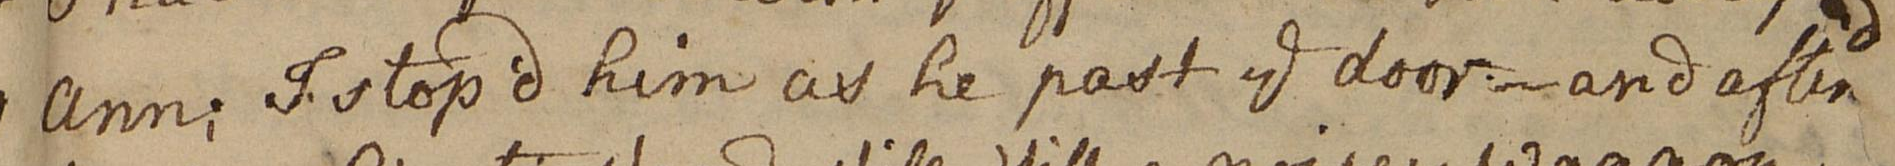Ann; I stop'd him as he past y^e door- and after
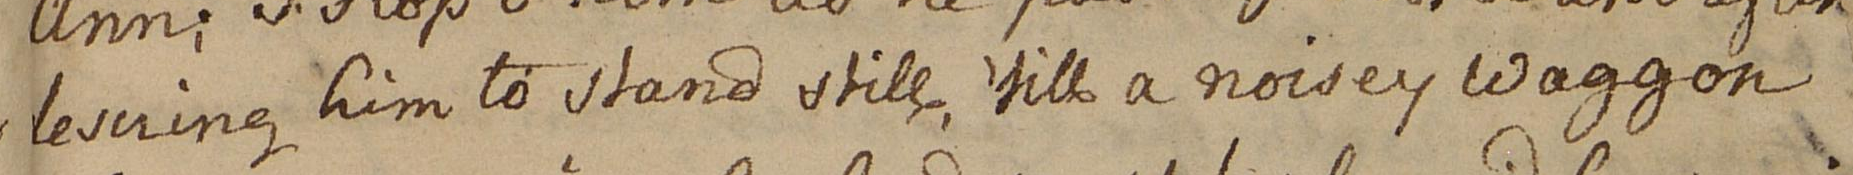desering him to stand still, 'till a noisey waggon
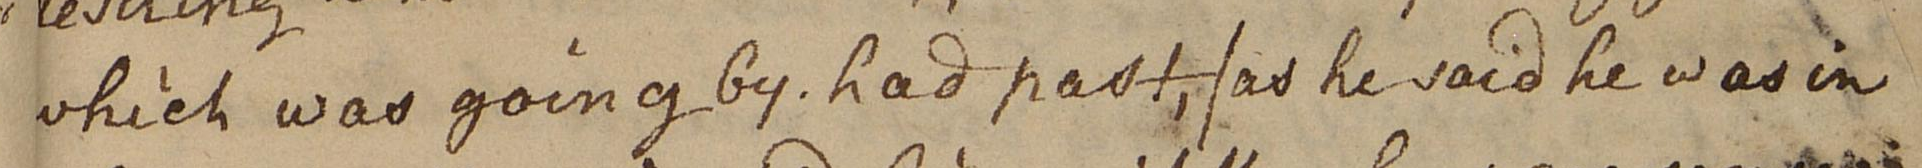which was going by had past, (as he said he was in
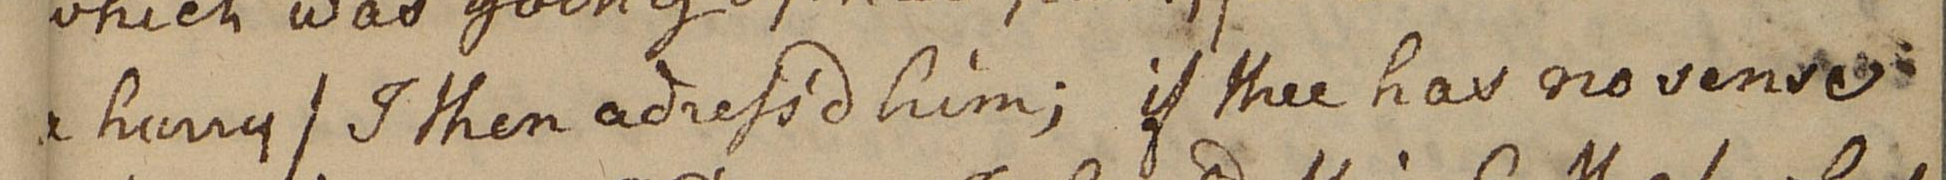a hurry) I then adress'd him; if thee has no sense
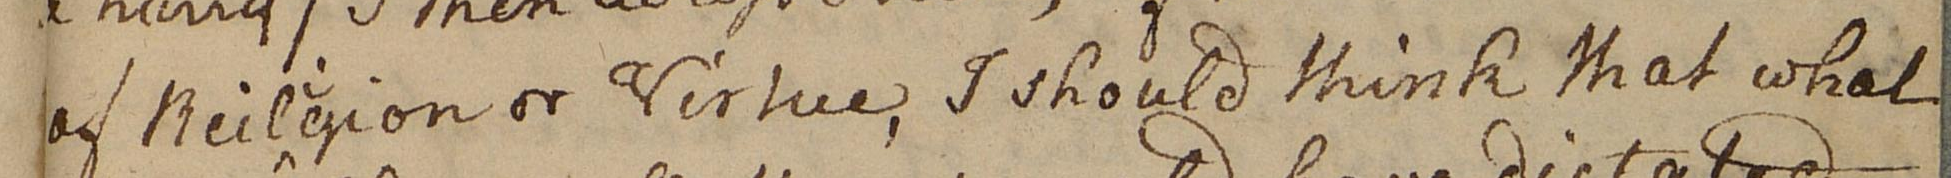of Reil^igion or Virtue, I should think that what
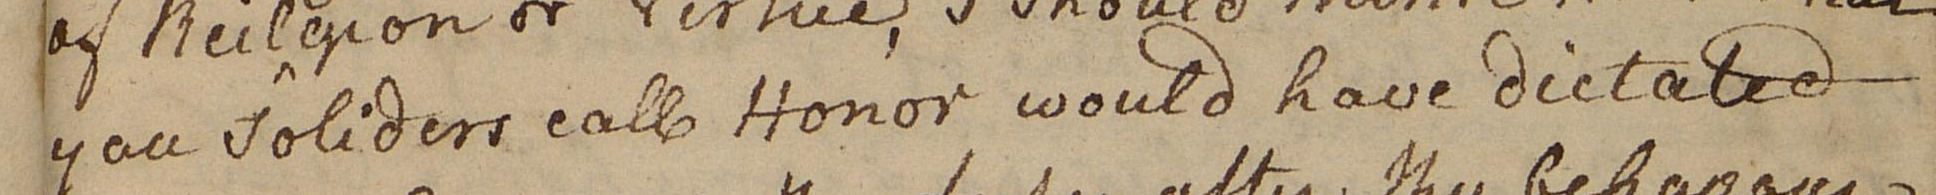you Soliders call Honor would have dictated
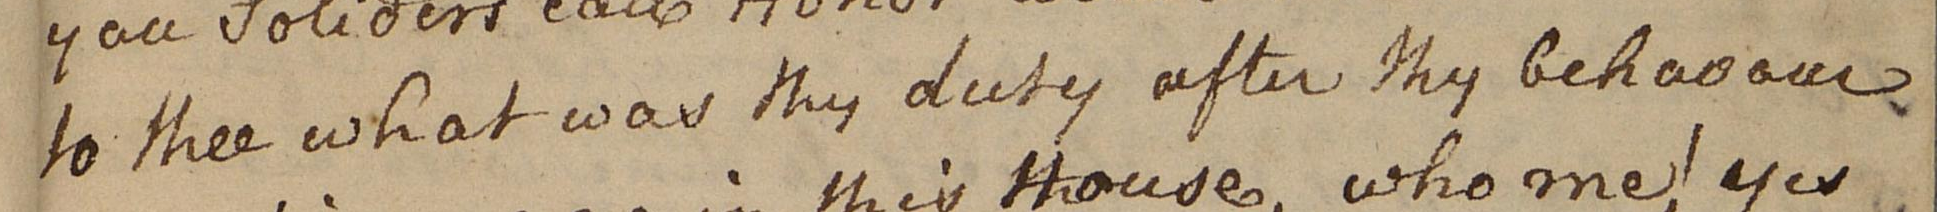to thee what was thy duty after thy behavaur
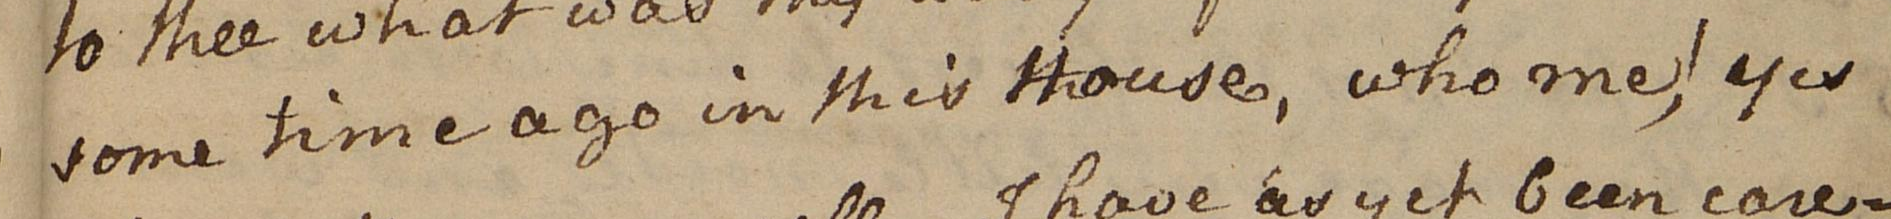some time ago in this House, who me, yes
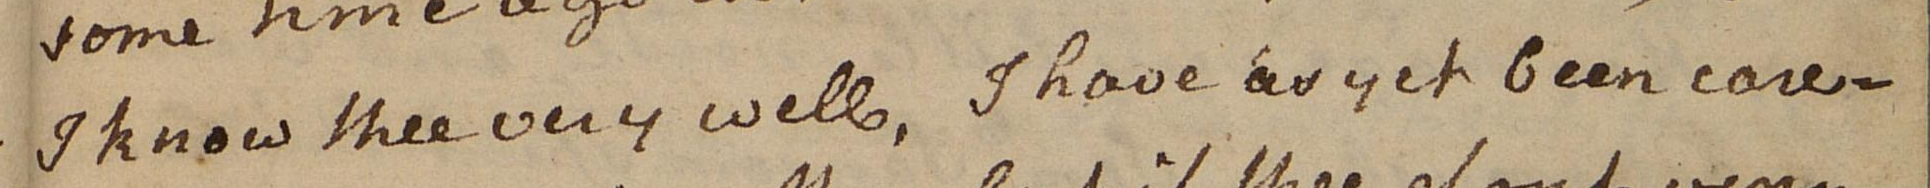I know thee very well, I have as yet been care-
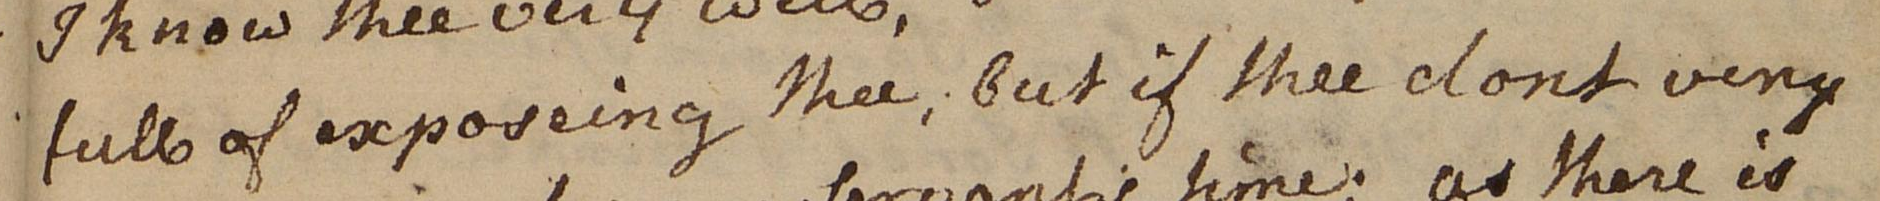full of exposeing thee, but if thee dont very
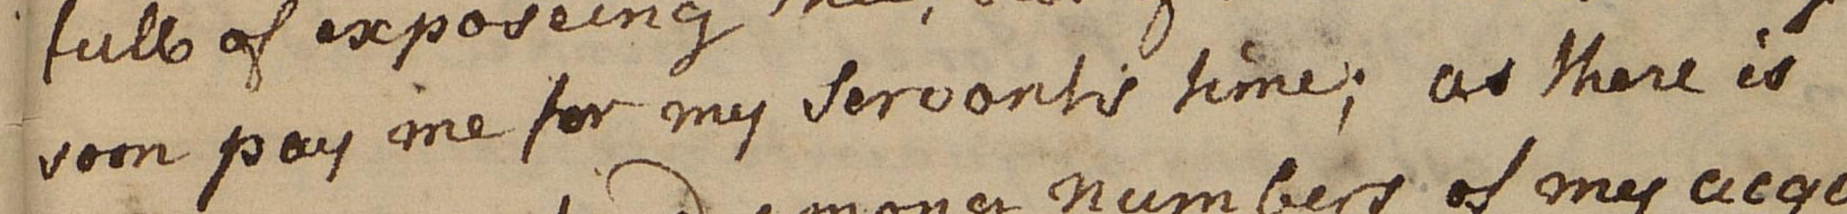soon pay me for my Servants time; as there is
